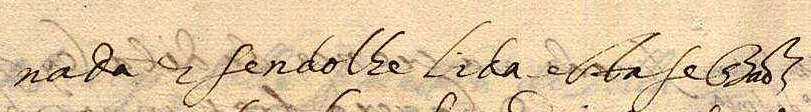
nada E sendolhe lida esta sessaõ
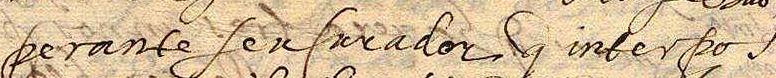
perante seu Curador q̄ interpos
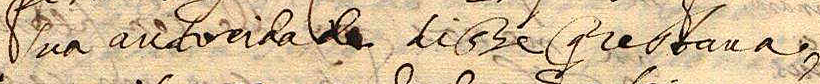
sua autoridade disse q̄ estaua
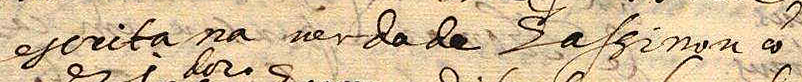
escrita na uerdade E assinou cō
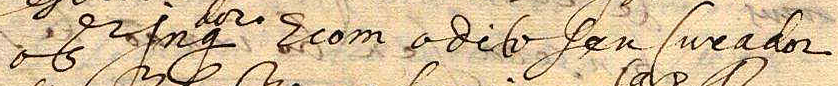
o sor Jnqdor E com o dito seu Curador
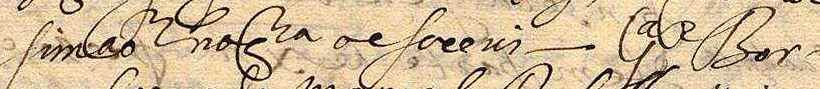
Simão nogra o escreui Gar Bor
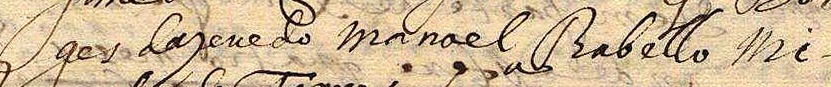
ges dazeuedo manoel Rabello Mi
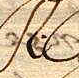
R.
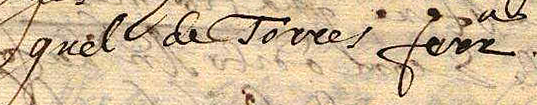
guel de Torres ferra
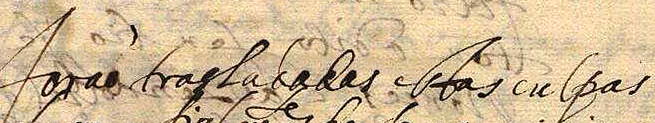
foraõ trasladadas estas culpas
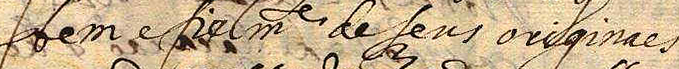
bem e fielmte de seus originaes
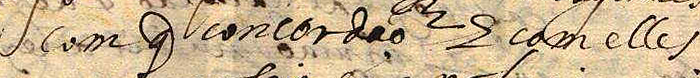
com q̄ concordaõ E com elles
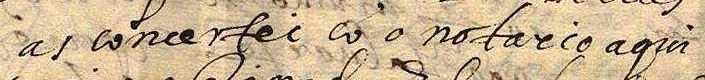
as concertei cō o notario aqui
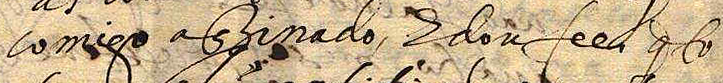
comigo assinado, E dou fee q̄ to
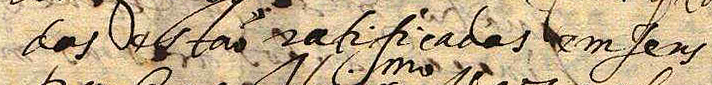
das estaõ ratificadas em seus
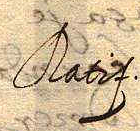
Ratif.
